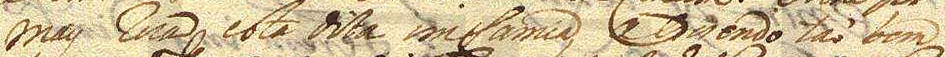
mais Rezaõ esta dita imfamia, a disendo taõbem
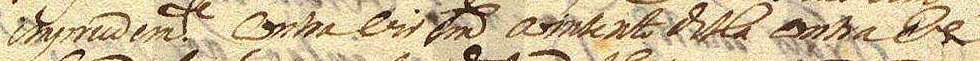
imprudem.te contra vir e mto ao intento della contra Ele
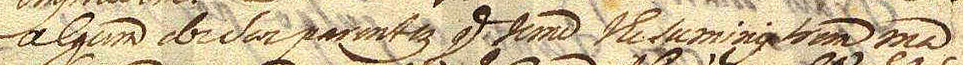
algum dos seoz parentes q̄ teme lhe suministrem ma
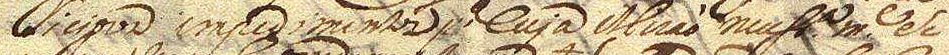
liciozoz impedimentoz p.a Cuja illuzaõ necesr.am.e Se
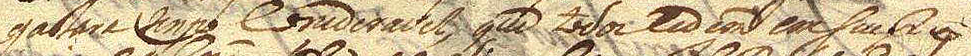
gastara tenpo Conideravel, que todoz cedem em seu bom
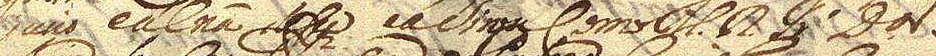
juiso e al naõ disse e asinou Como M. R. sr. D.or
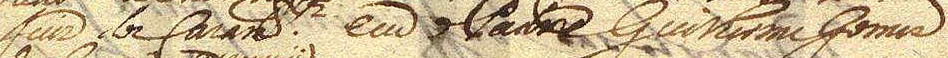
Juiz doz Cazam.toz e eu o Padre Guilherme Gomez
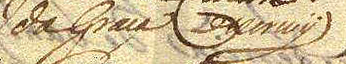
da Graça escreuy
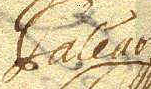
Falcão
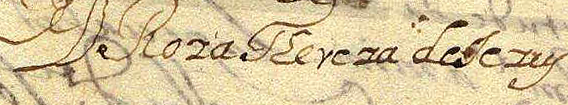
De Roza Thereza de Iezus
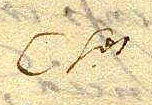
Clos
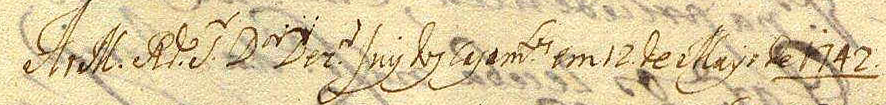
Ao M. Rd.o S.r D.or Dez.r Juis dos Casam.tos em 12 de Mayo de 1742.
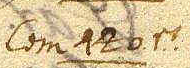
Com 140rs.
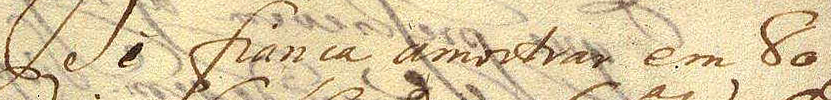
Dé fiança a mostrar em 80
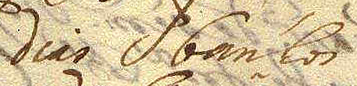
dias banhos
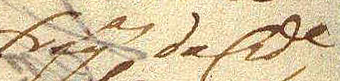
freg.a da Cide
